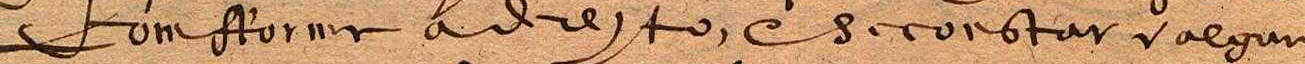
Comforme a derejto, e se constar ē algum
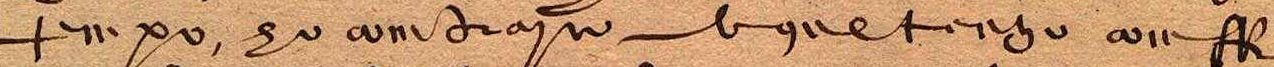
tempo, ho comtrajro do que tenho comffe
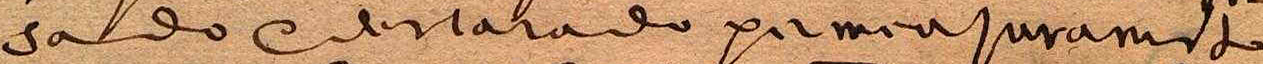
sado e declarado per meu juramēto
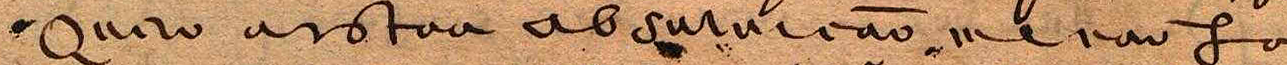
Quero a estaa absuluição me naõ ha
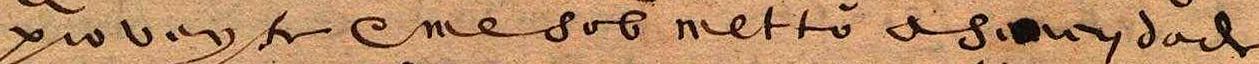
proveyte e me sobmetto a seuerjdade
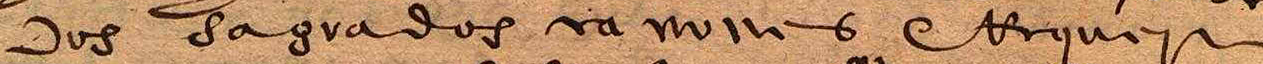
Dos sagrados canones e Requejro
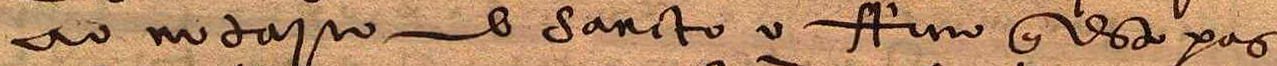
ao notajro do sancto officio q̄ desto pase
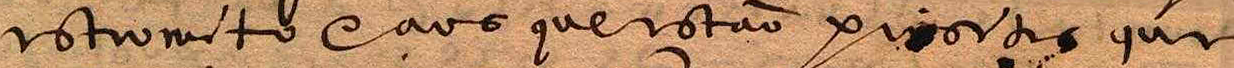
estromēto e aos que estaõ presētes que
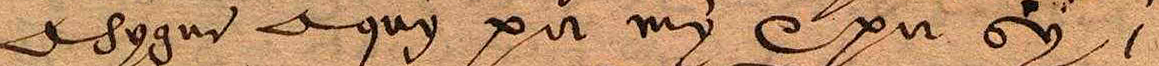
asygnē aquy por mȳ e por sy /.
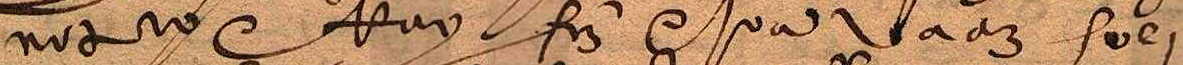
notro e Ruy frz̄ e Joā vaaz solj
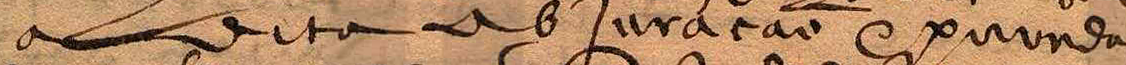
a dita abJuracaõ e por verda
